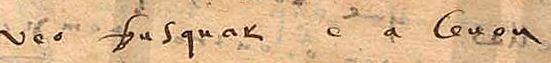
veo busquar e a leuou
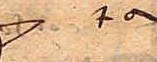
8ta
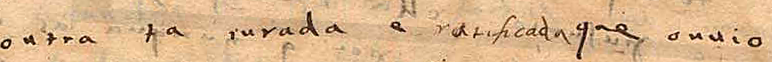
outra ta iurada e ratificada que ouuio
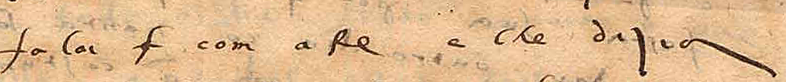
falar f com a Re e lhe dizia
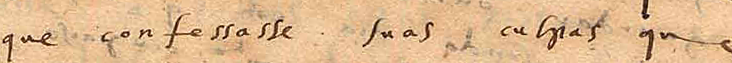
que confessasse suas culpas que
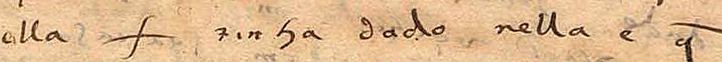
ella f tinha dado nella e q̅
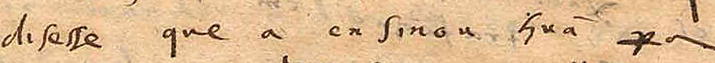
disesse que a ensinou hua̅ ꝑa
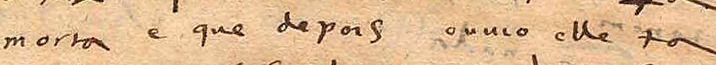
morta e que depois ouuio elle ta
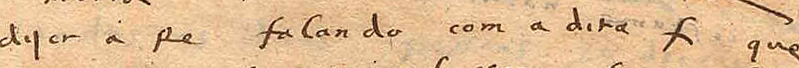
dizer a Re falando com a dita f que
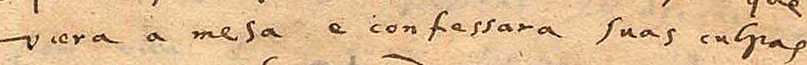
viera a mesa e confessara suas culpas
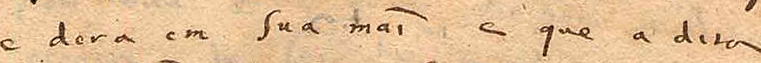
e dera em sua maī e que a dita
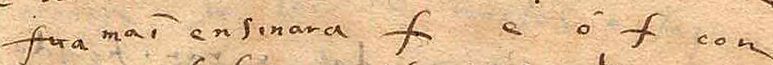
sua maī ensinara f e o f com
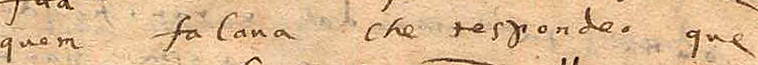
quem falaua lhe respondeo que
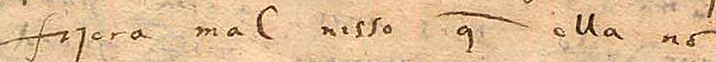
fizera mal nisso q̅ ella no̅
